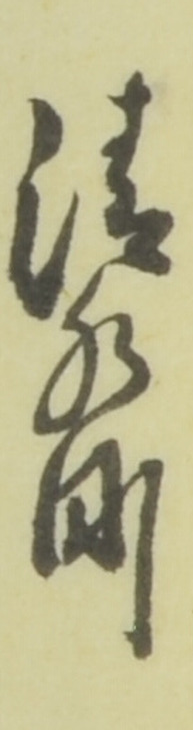清水町
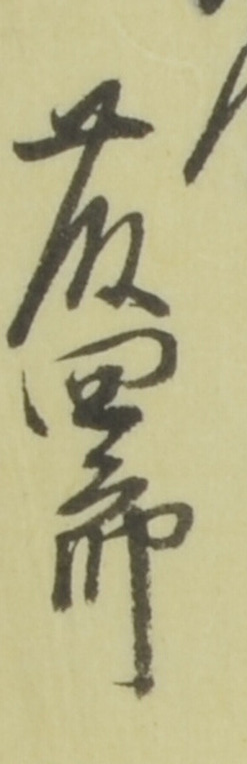藤四郎
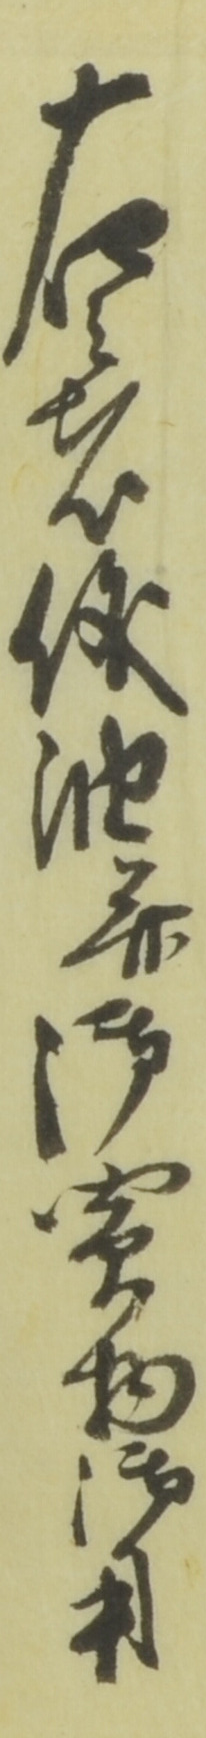右之者儀油并御買物御用
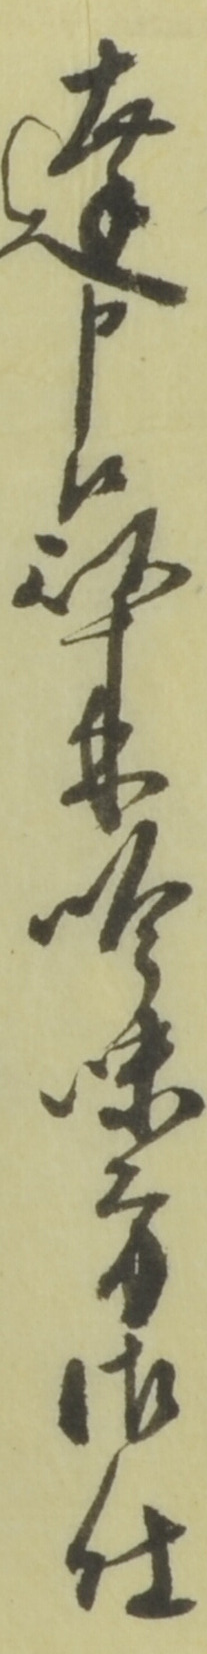達申候以来吟味方御仕
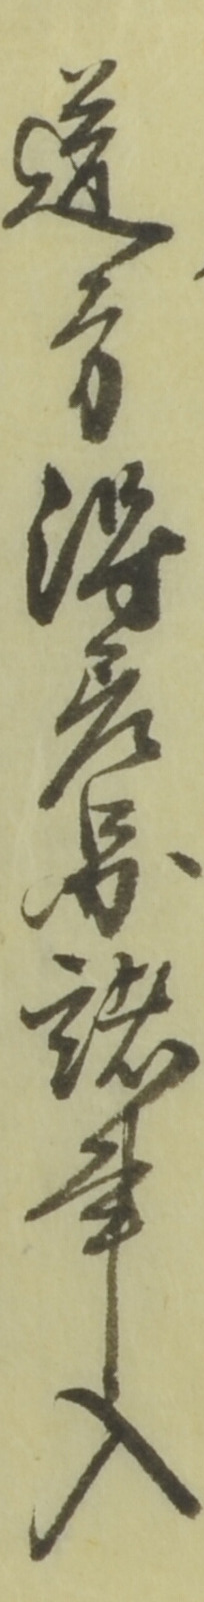送方得差図諸事入
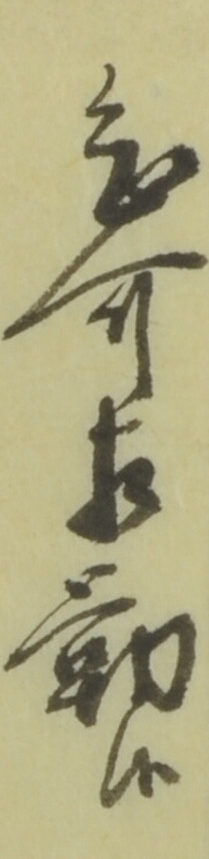念可相勤候
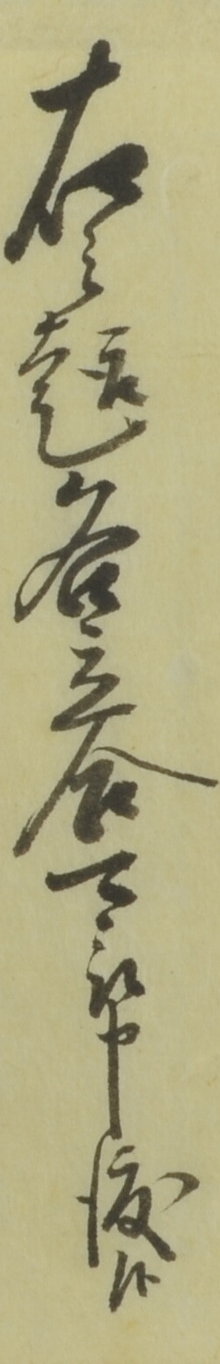右之趣各立合可被申渡候
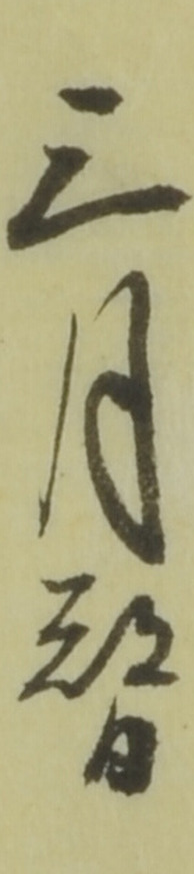三月朔日
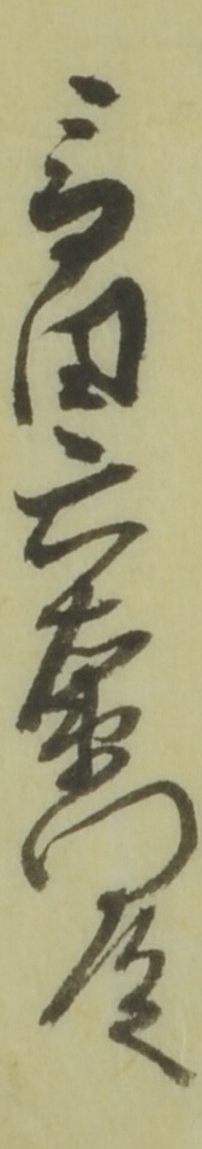高田六右衛門殿
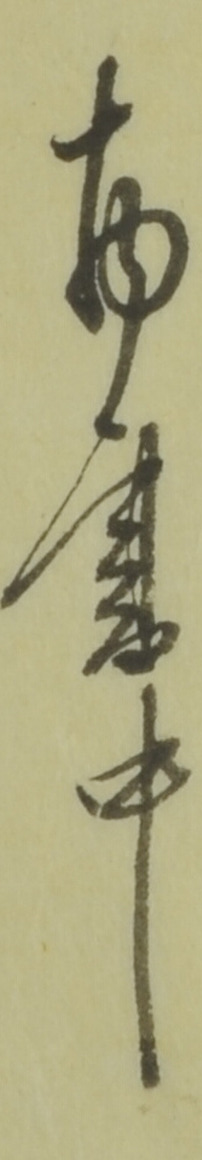物書中
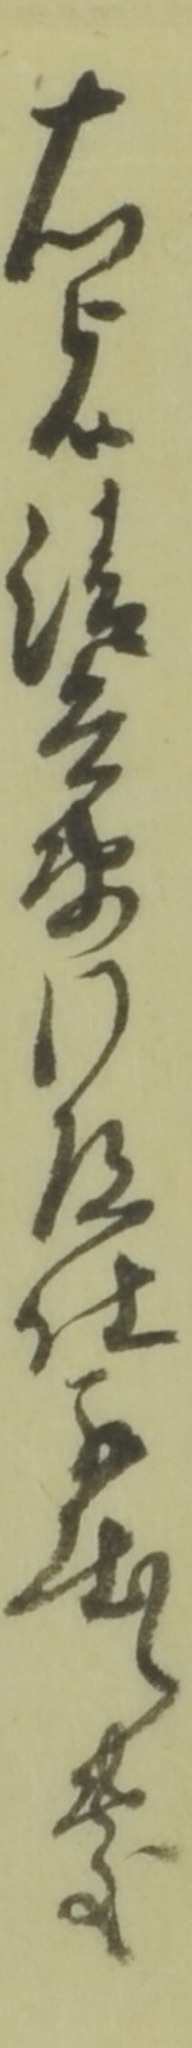右は清兵衛同道仕罷出候処
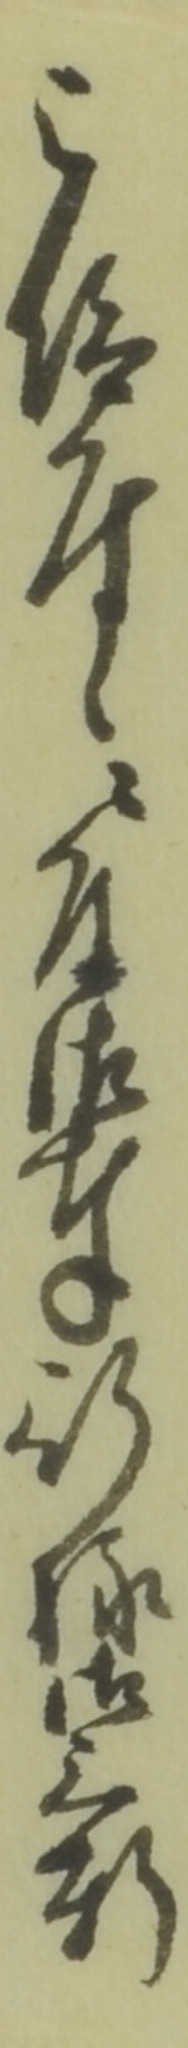被仰付候ニ付御奉行様御三軒
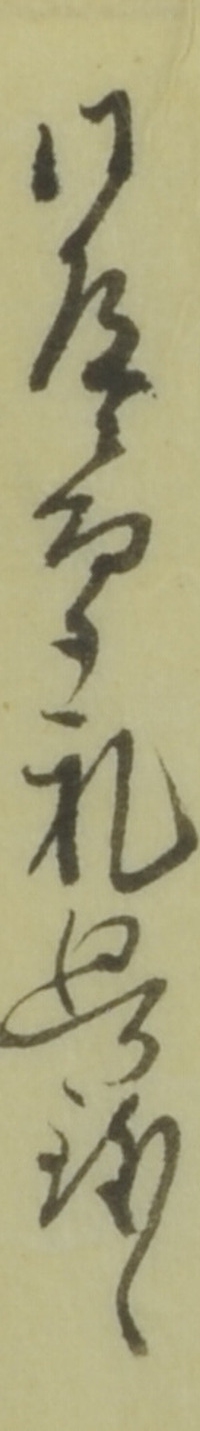同道ニ而御礼廻り致候
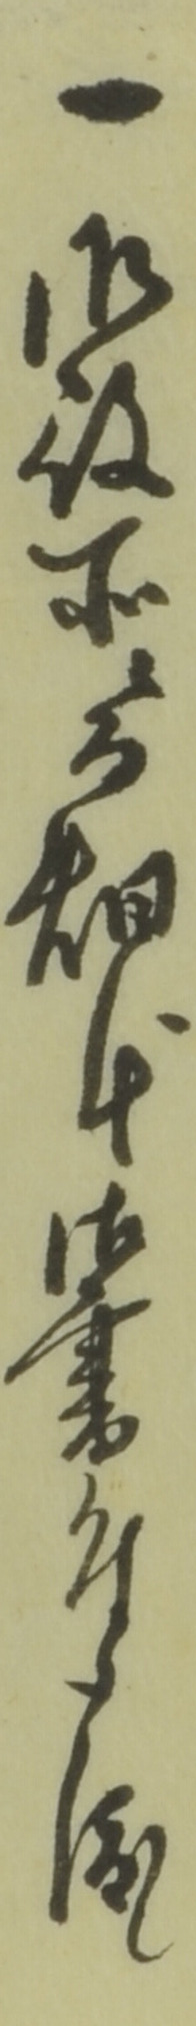一御役所ニ而畑本御書付御渡し
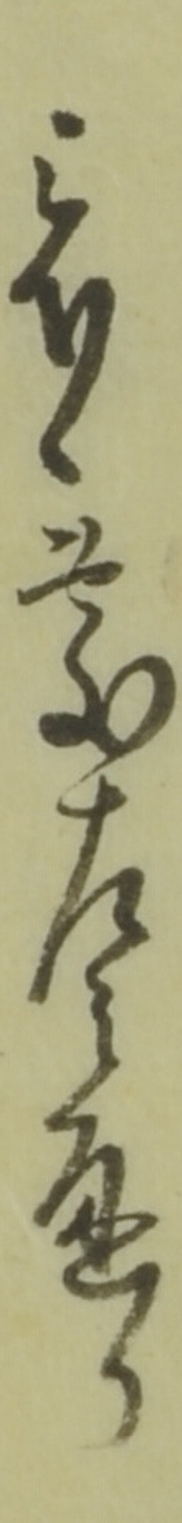被下候処左之通り
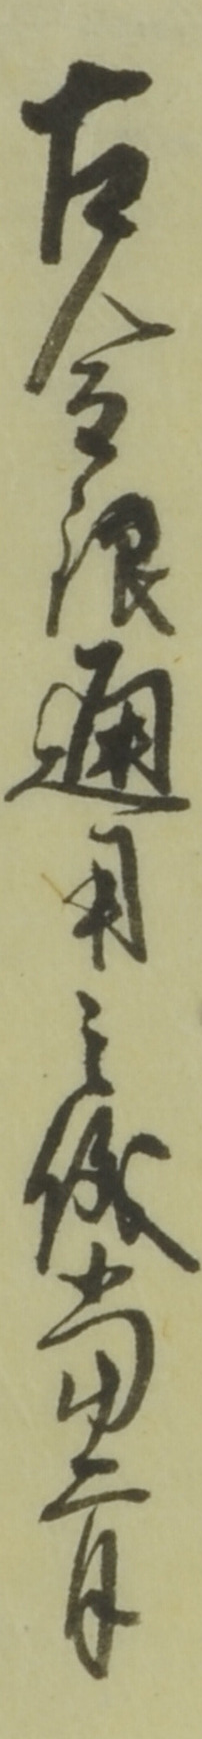古金銀通用之儀当二月
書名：御触書御書附控
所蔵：伊那市立高遠町図書館・合同会社AMANE
